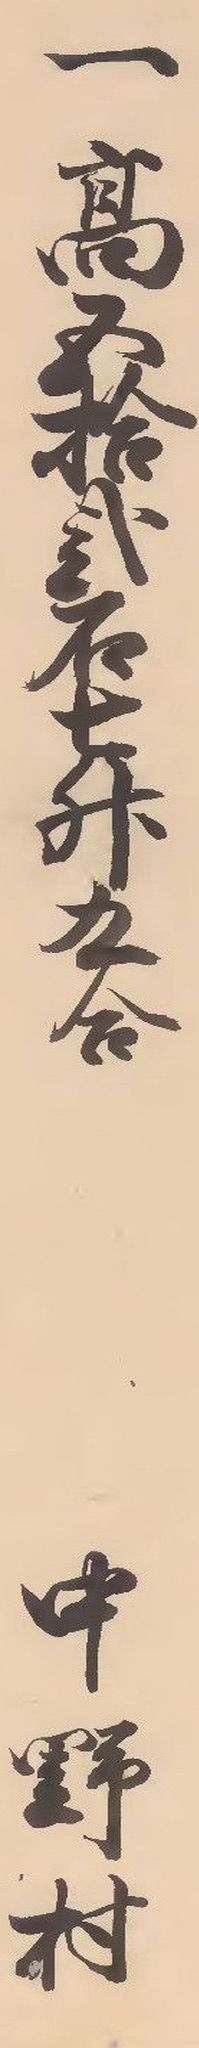一高五拾弐石七升九合中野村
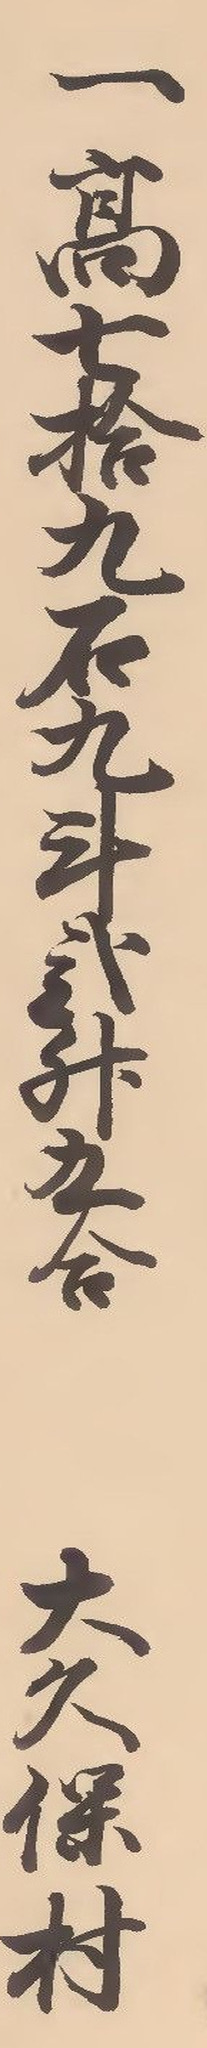一高七拾九石九斗弐升九合大久保村
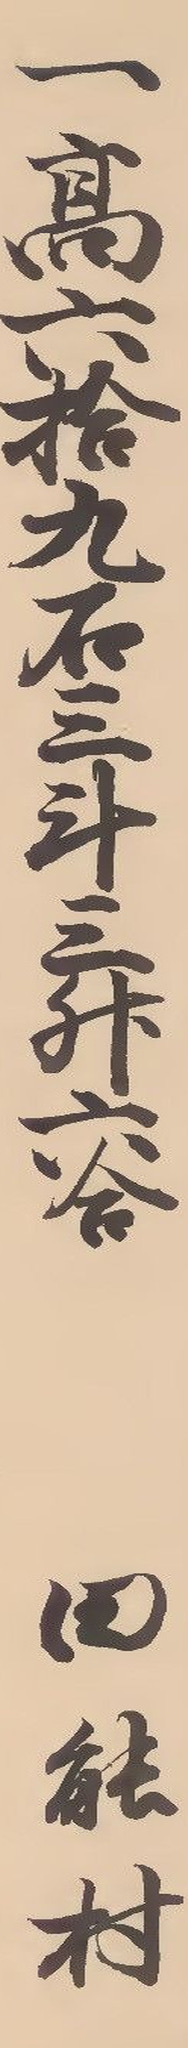一高六拾九石三斗三升六合田能村
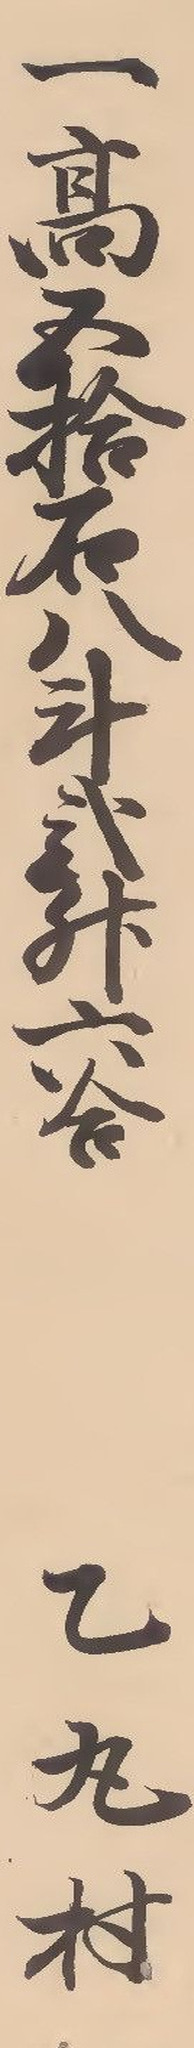一高五拾石八斗弐升六合乙丸村
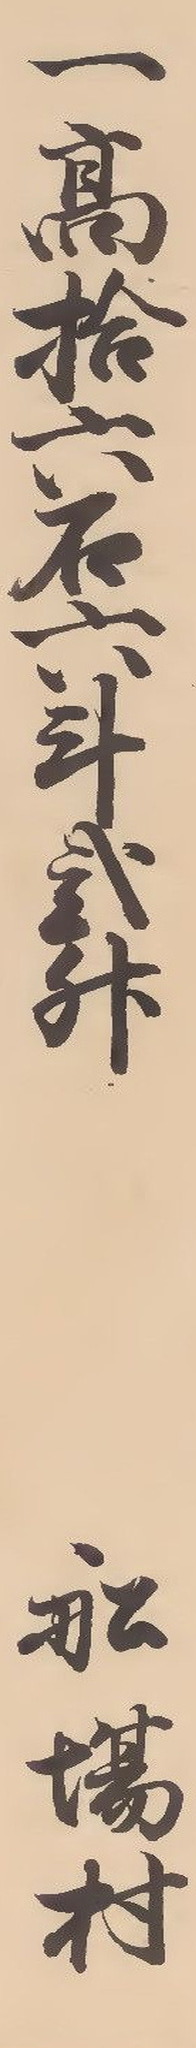一高拾六石六斗弐升船場村
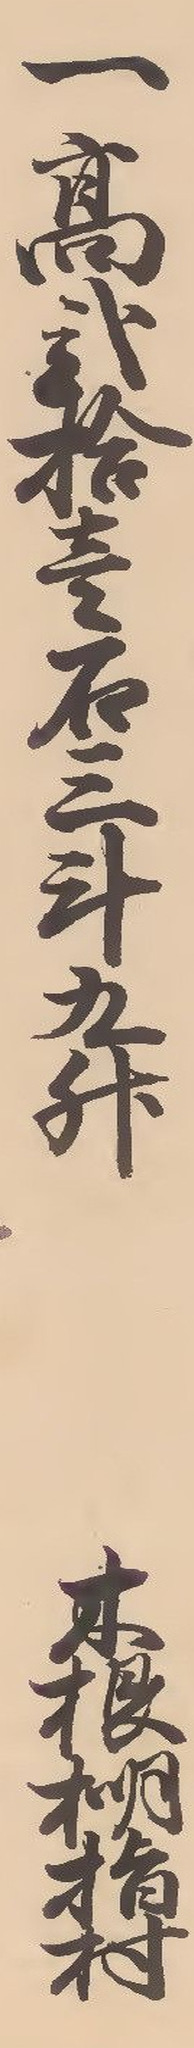一高弐拾壱石三斗九升木根棚指村

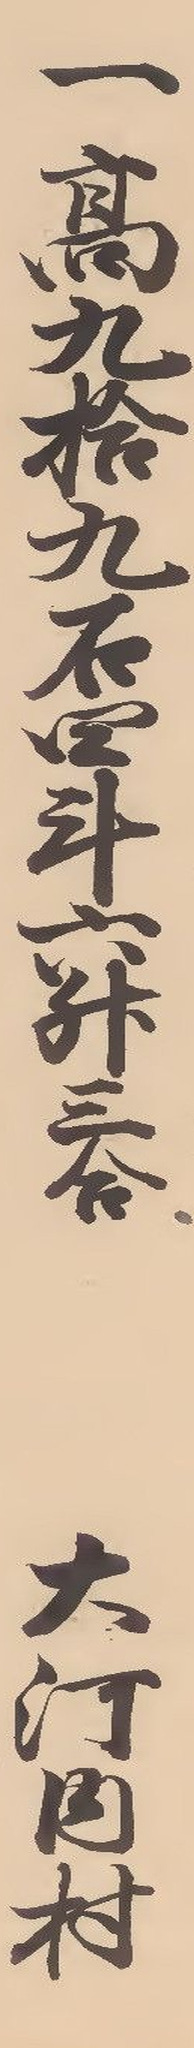一高九拾九石四斗六升三合大河内村
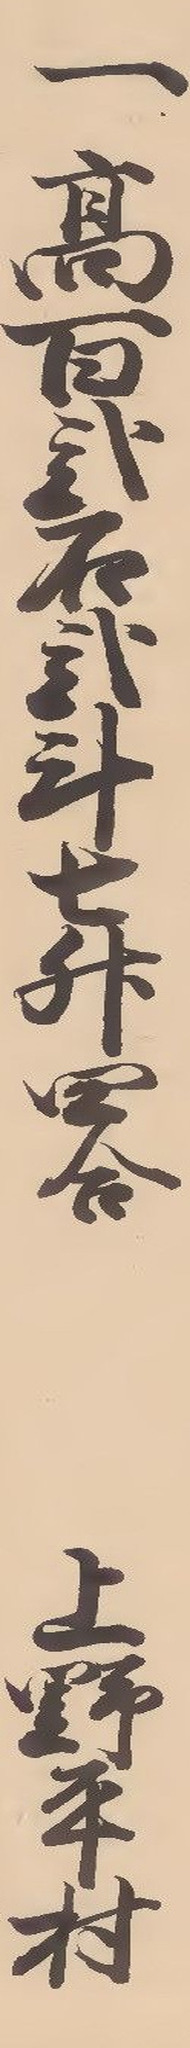一高百弐石弐斗七升四合上野平村
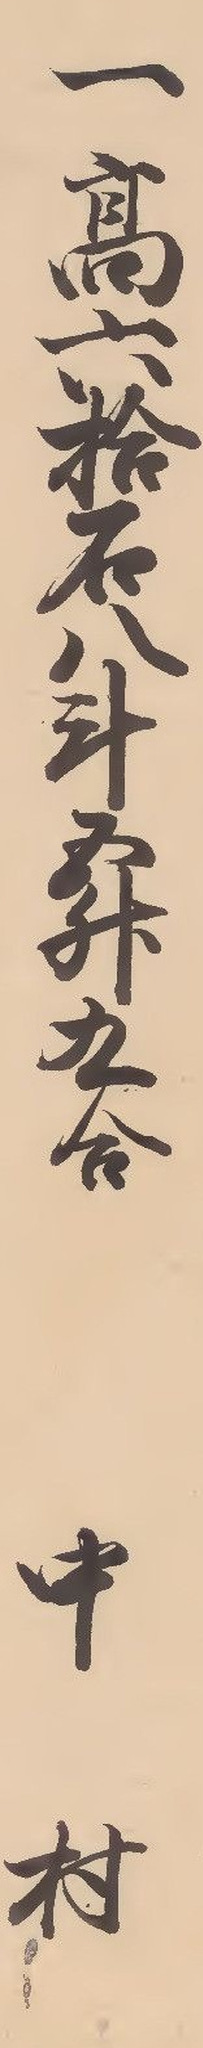一高六拾石八斗五升九合中村
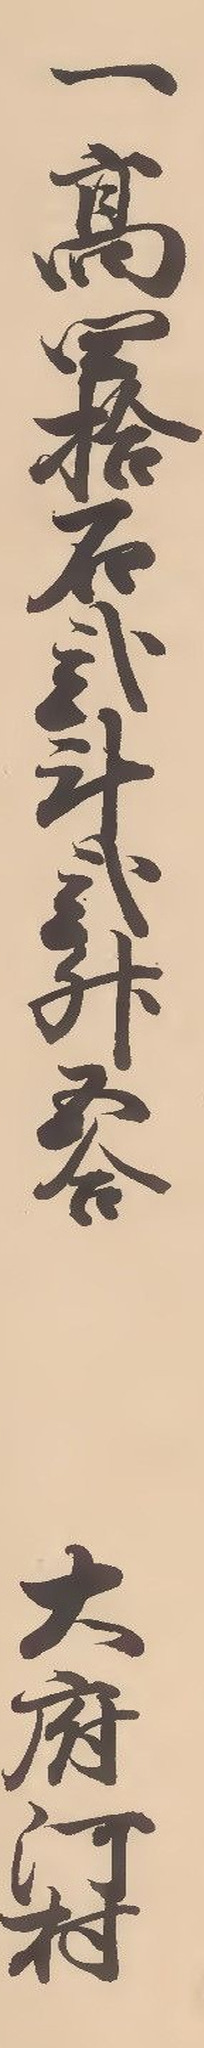一高四拾石弐斗弐升五合大府河村
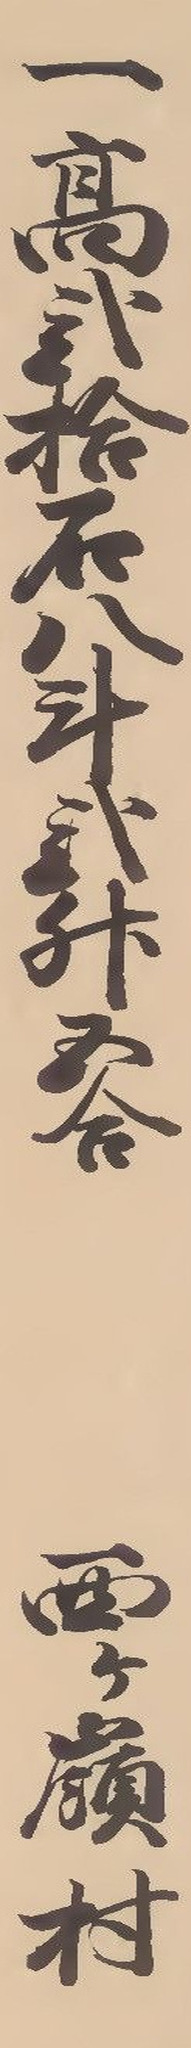一高弐拾石八斗弐升五合西ヶ嶺村
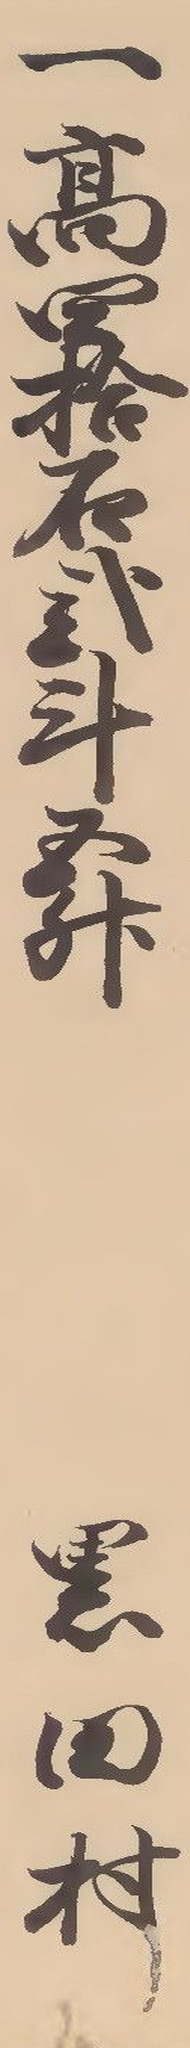一高四拾石弐斗五升黒田村
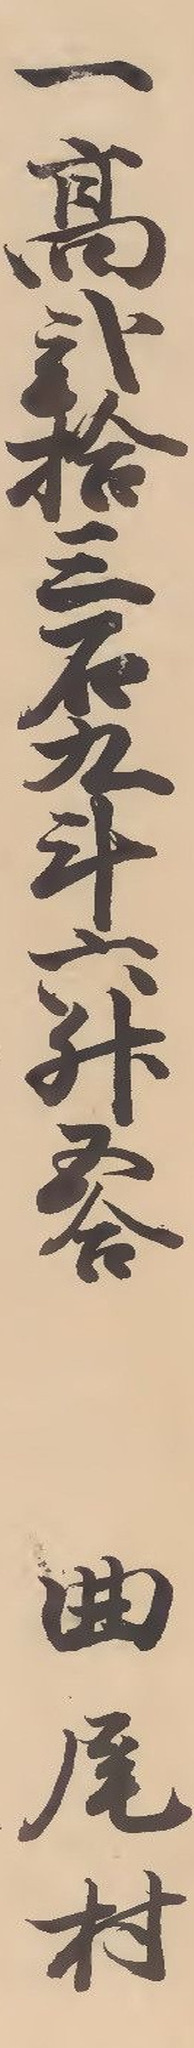一高弐拾三石九斗六升五合曲尾村
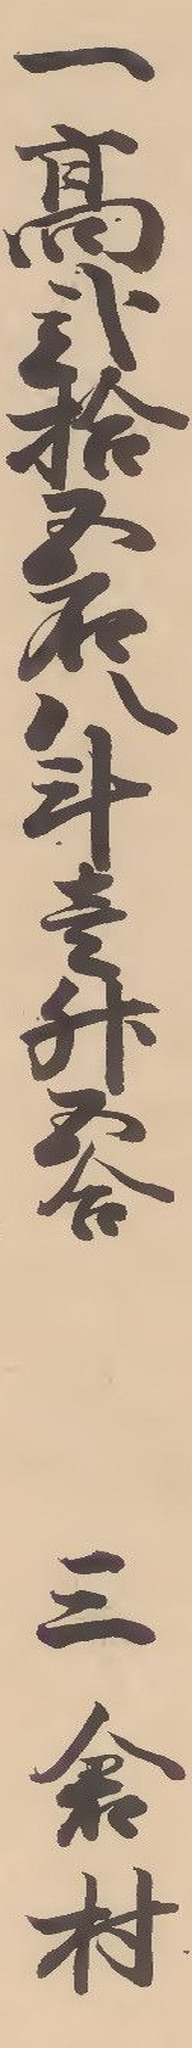一高弐拾五石八斗壱升五合三倉村

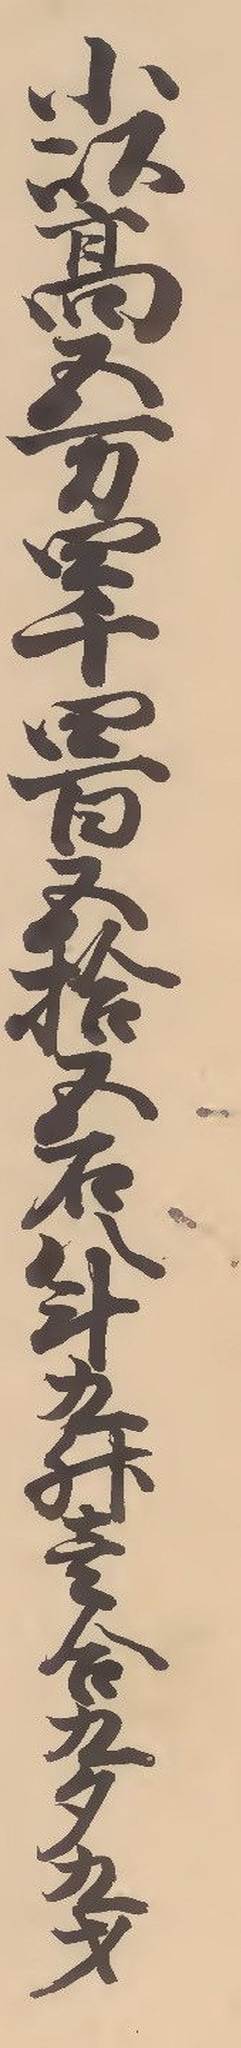小以高五万四千四百五拾五石八斗九升壱合九勺九才
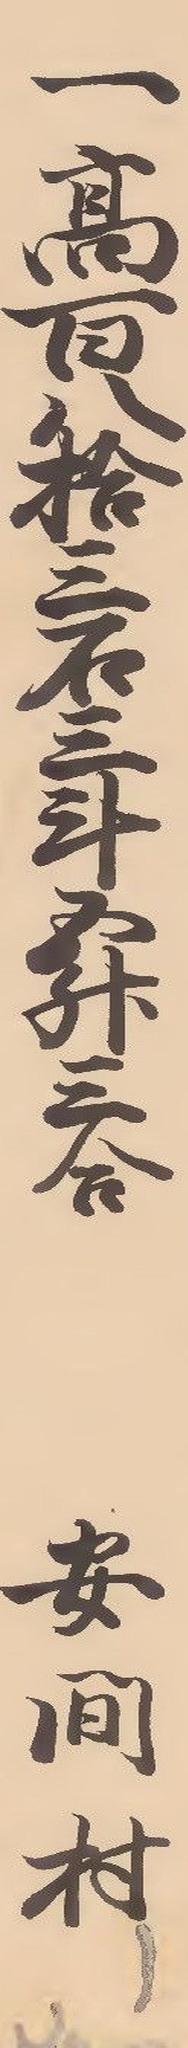一高百八拾三石三斗五升三合安間村
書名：遠江国郷帳
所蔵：国立公文書館 National Archives of Japan
